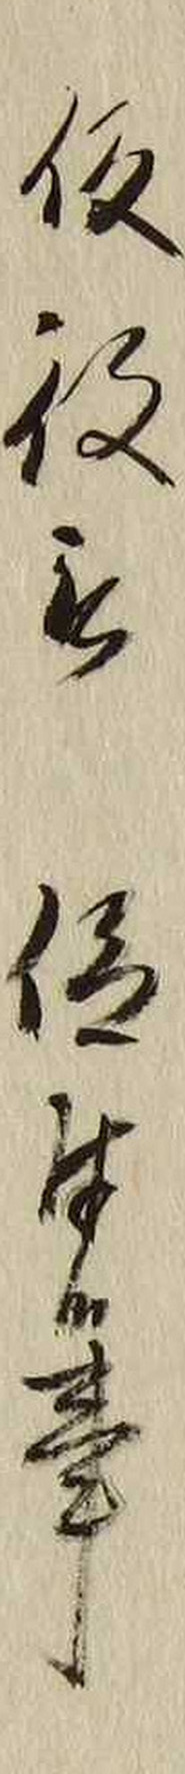仮役被仰付候事
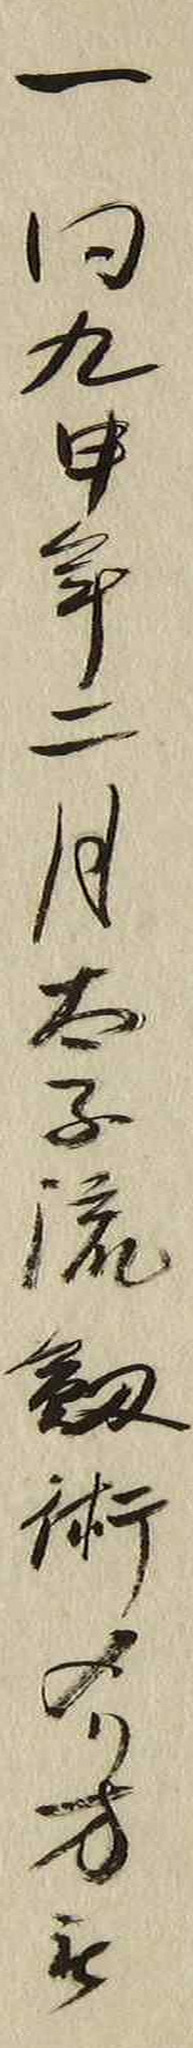一同九申年二月太子流剣術〆り方被
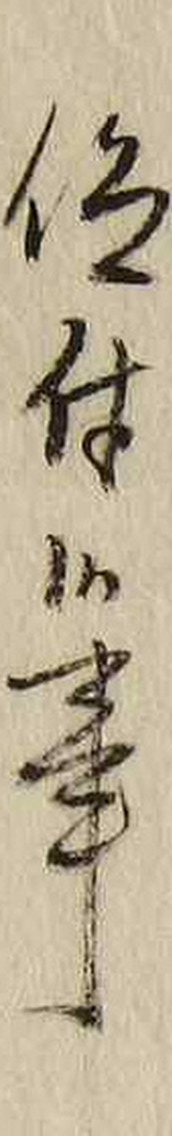仰付候事
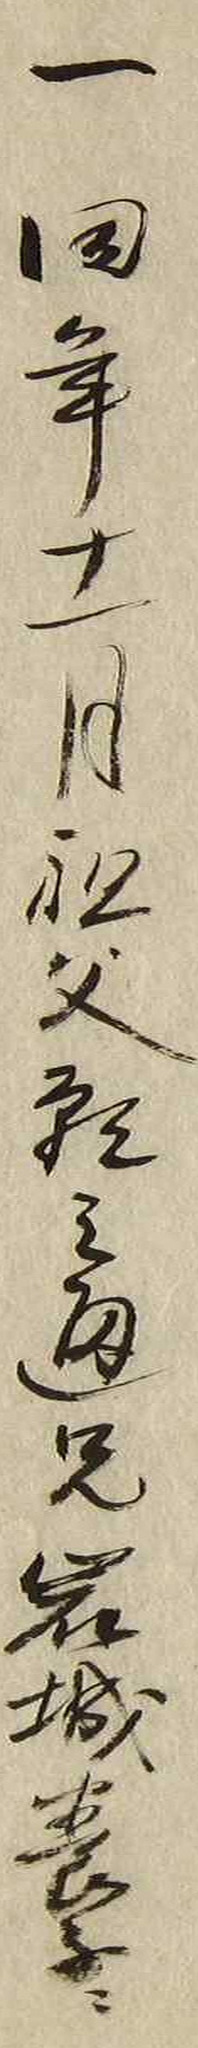一同年十一月祖父願之通兄岩城養子ニ
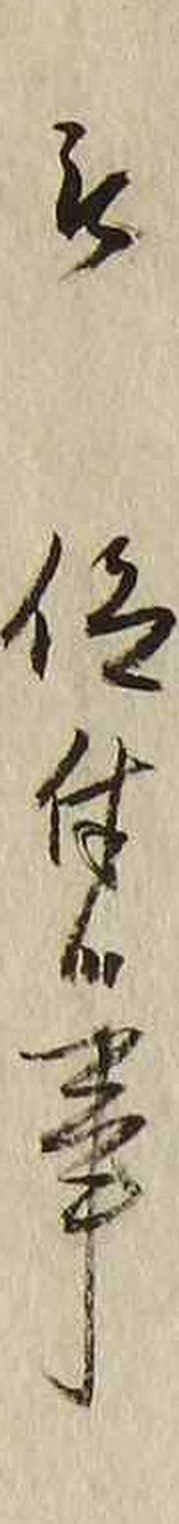被仰付候事
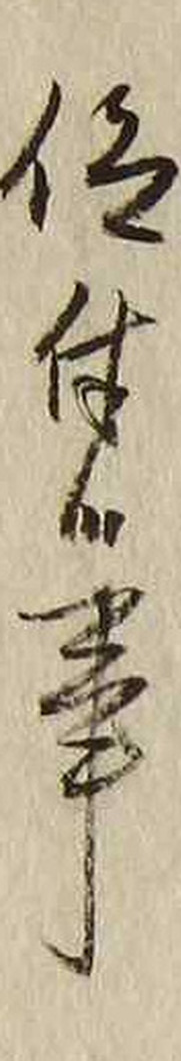仰付候事

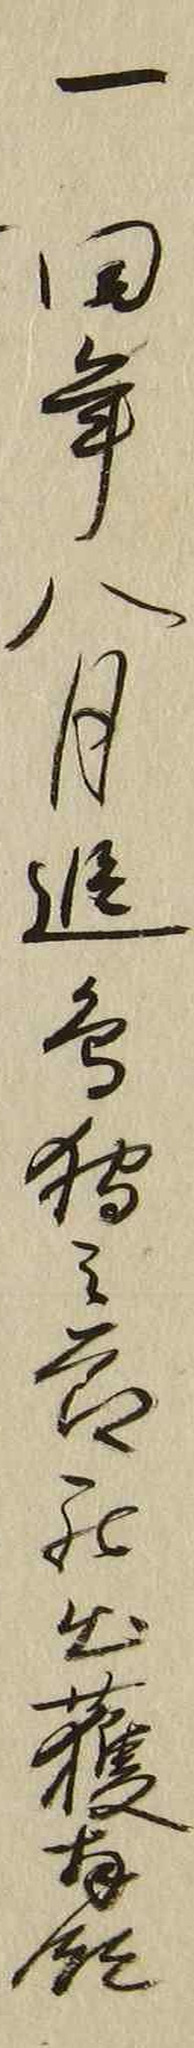一同年八月追鳥狩之節罷出獲拝領
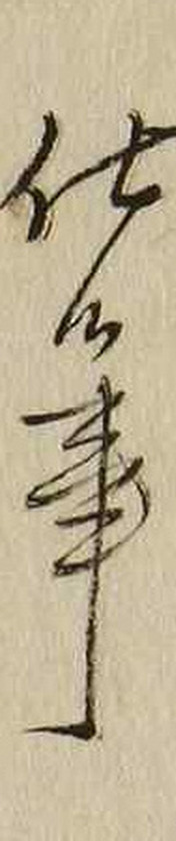仕候事
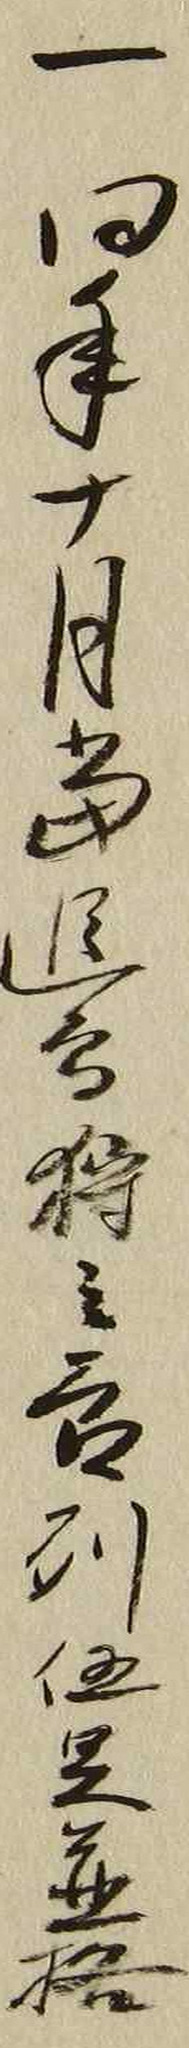一同年十月当追鳥狩之節列伍足並格
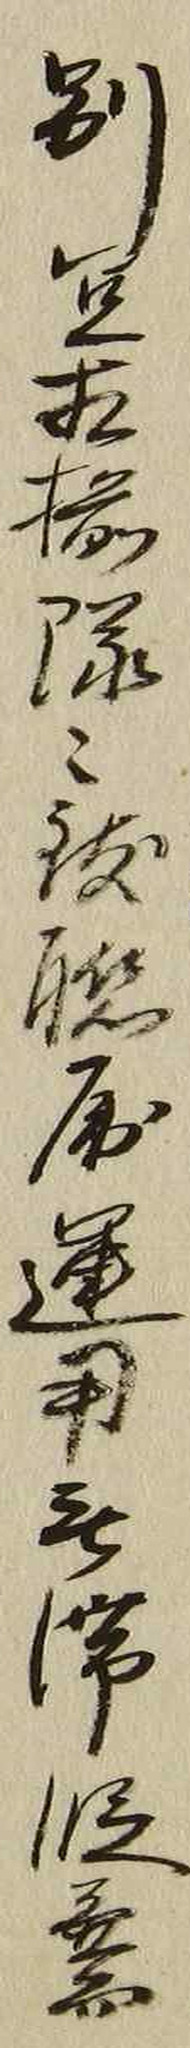別宜相揃隊々致聯属運用無滞段兼而
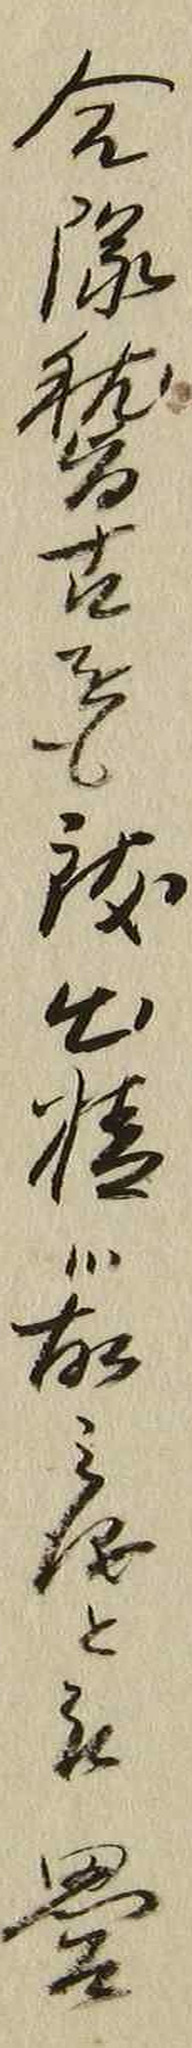合隊稽古をも致出精候故之儀と被思召
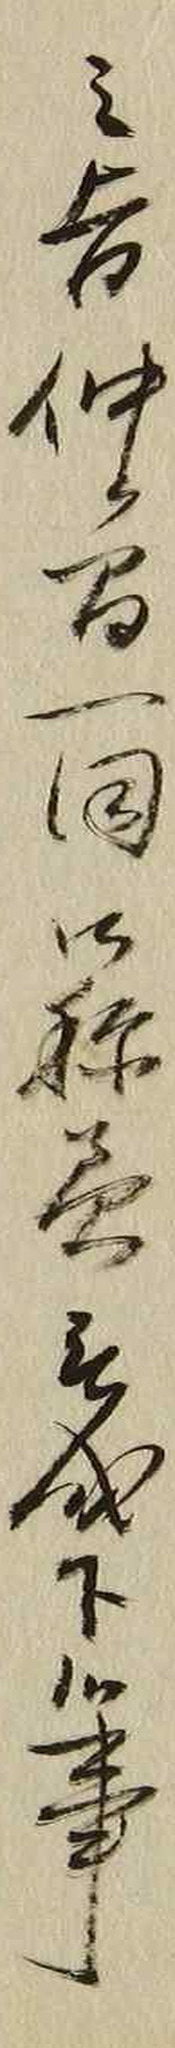之旨仲間一同御称美被成下候事
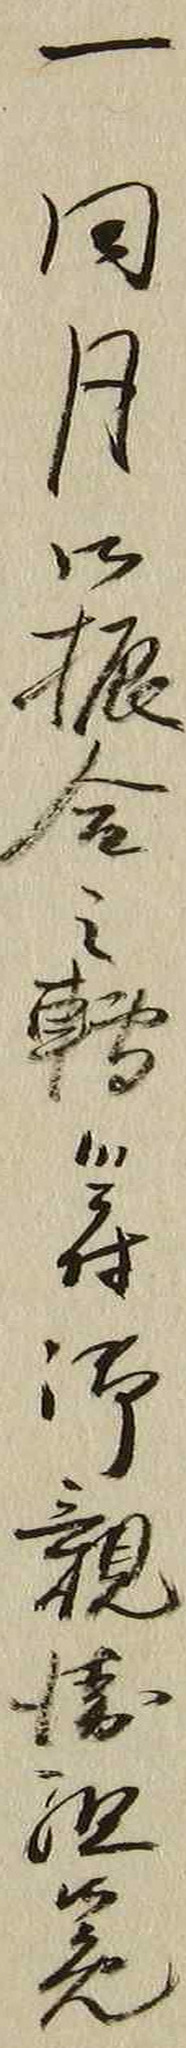一同月御振合之転候ニ付御親衛組御免
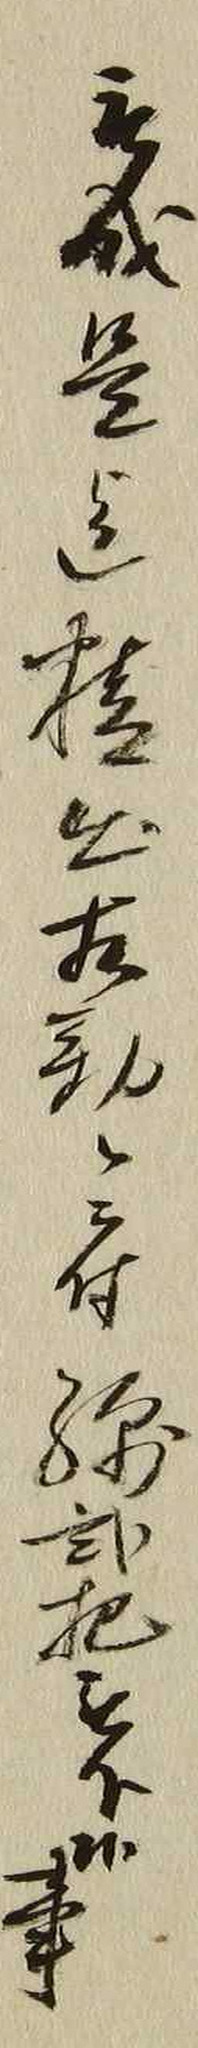被成是迄精出相勤候ニ付綿弐把被下候事
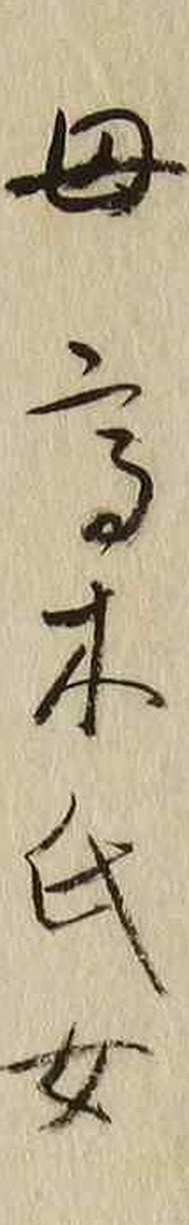母高木氏女
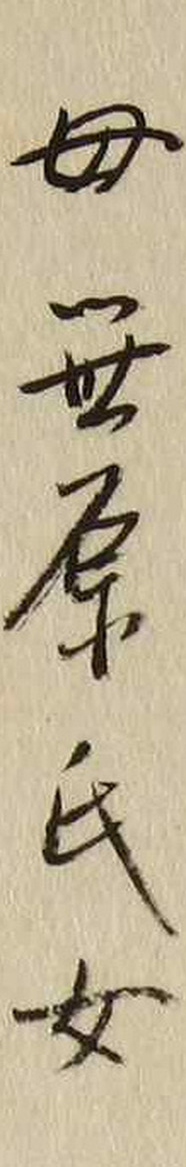母笹原氏女
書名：諸士系譜　巻之345　も之部1
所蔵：会津若松市立会津図書館
